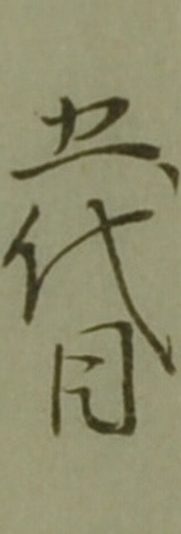五代目
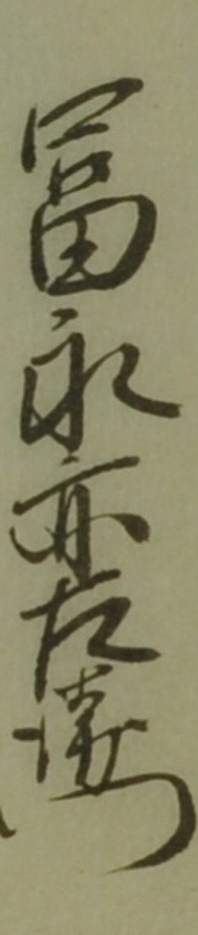冨永亦左衛門
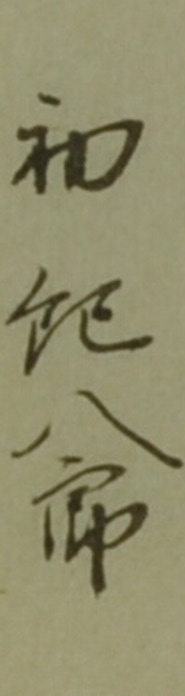初紀八郎
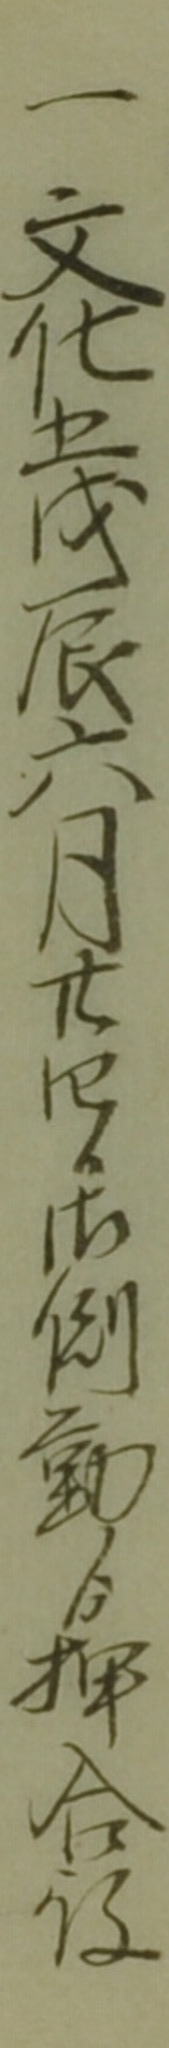一文化五戊辰六月廿四日御側勤ゟ押合役
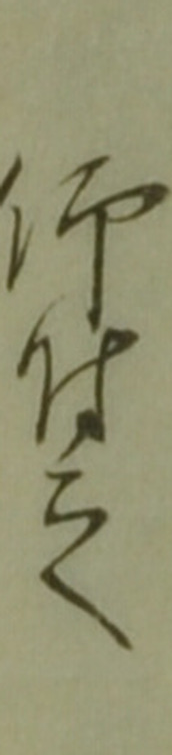仰付之
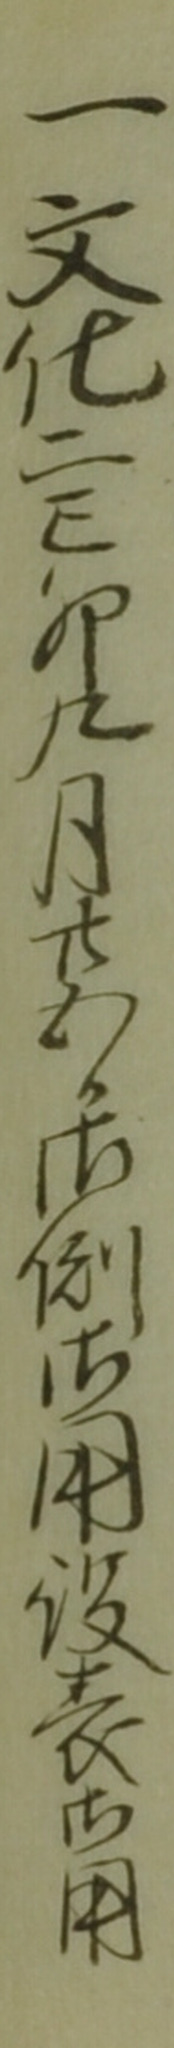一文化二己卯九月廿五日御側御用役表御用
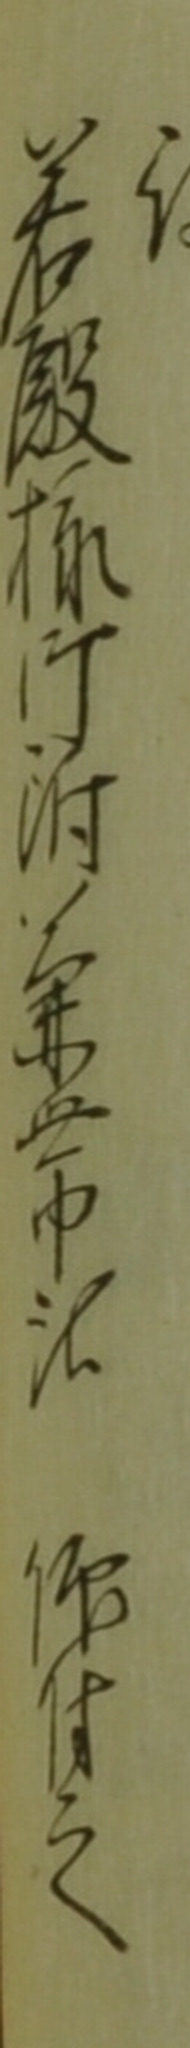若殿様御附兼帯被仰付之
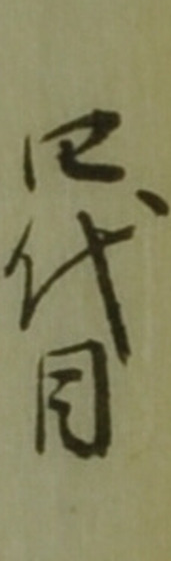四代目
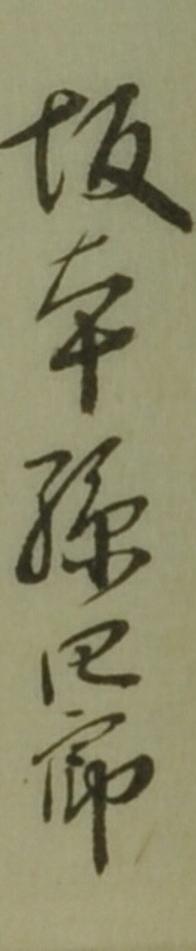坂本孫四郎
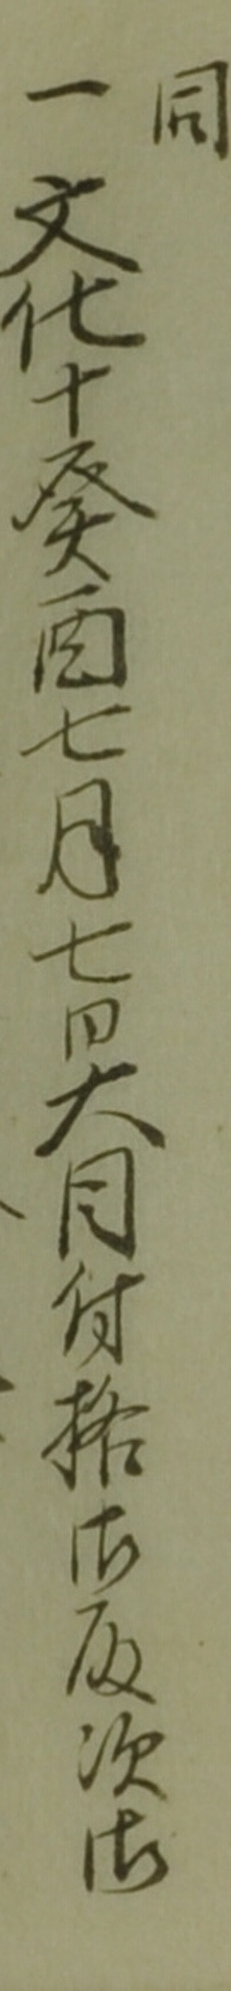一文化十癸酉七月七日大目付格御取次御
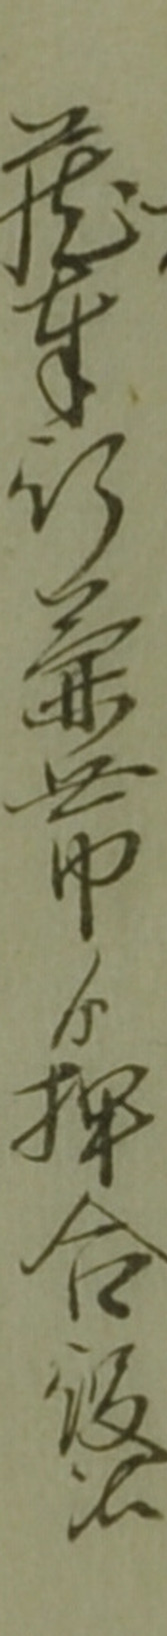蔵奉行兼帯ゟ押合役被
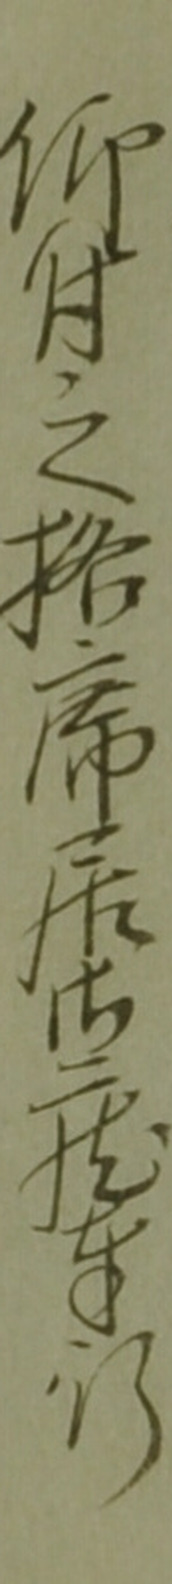仰付之格席居御蔵奉行
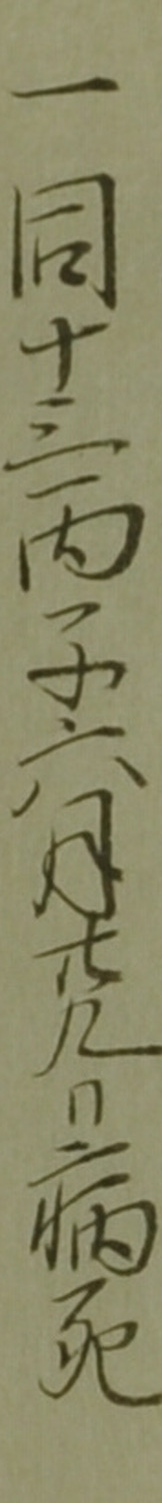一同十三丙子六月廿九日病死
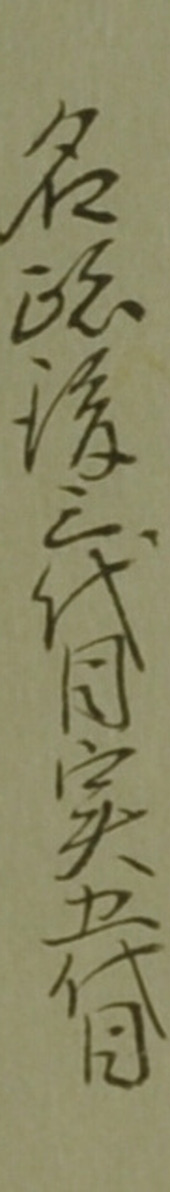名跡後三代目実五代目
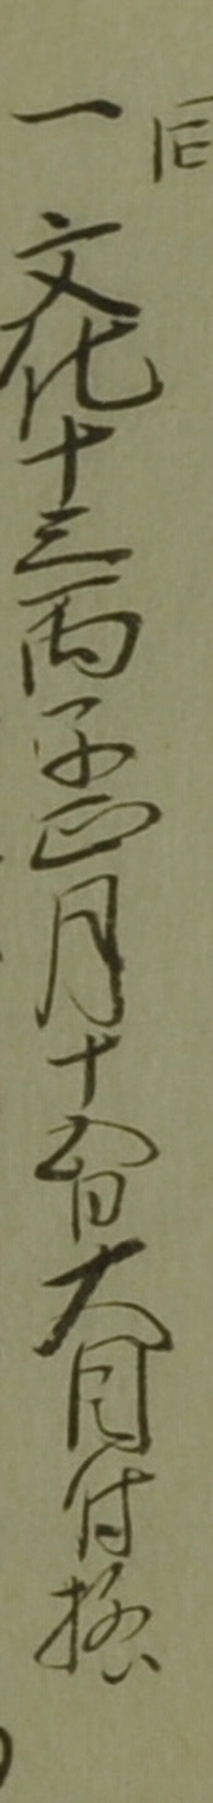一文化十三丙子正月十五日大目付格
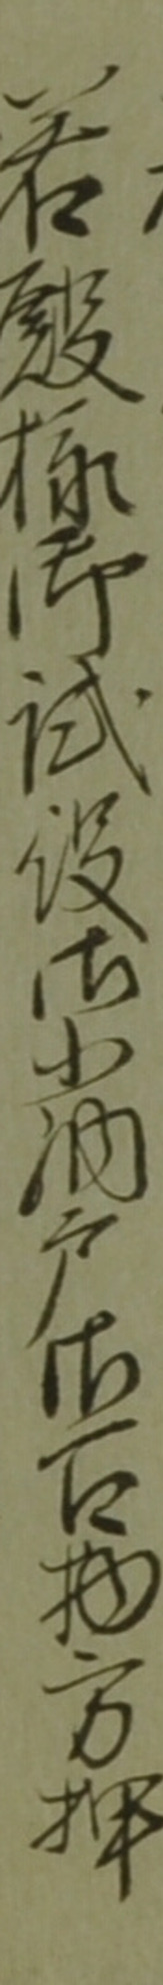若殿様御試役御小納戸御召物方押
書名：諸御役代々録（七）
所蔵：伊那市立高遠町図書館・合同会社AMANE
